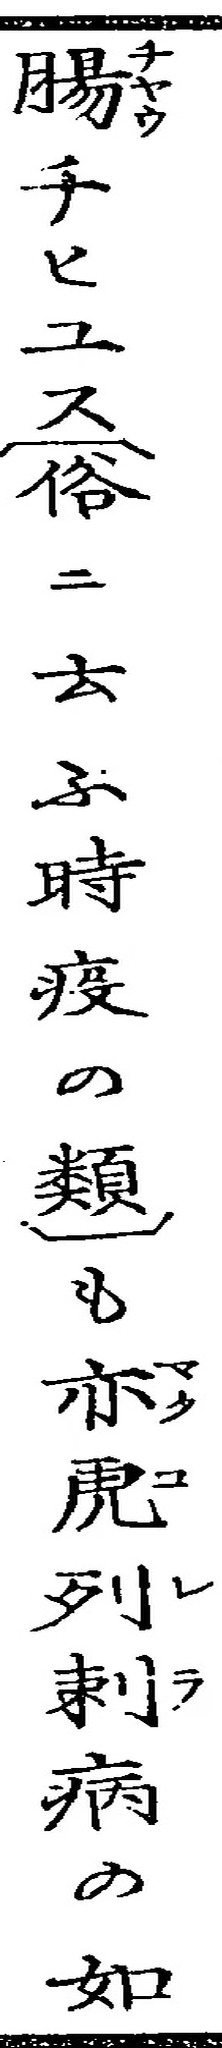腸チヒユス[俗に云ふ時疫の類]も亦虎列刺病の如
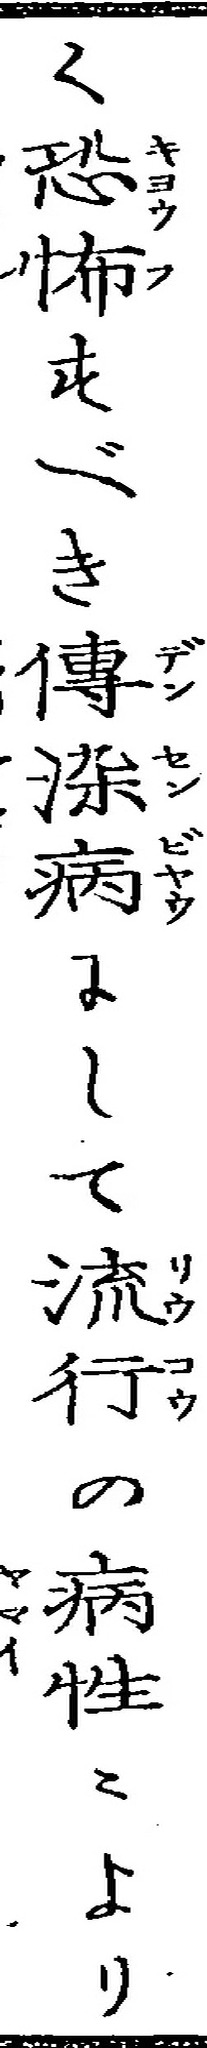く恐怖すべき伝染病にして流行の病性により
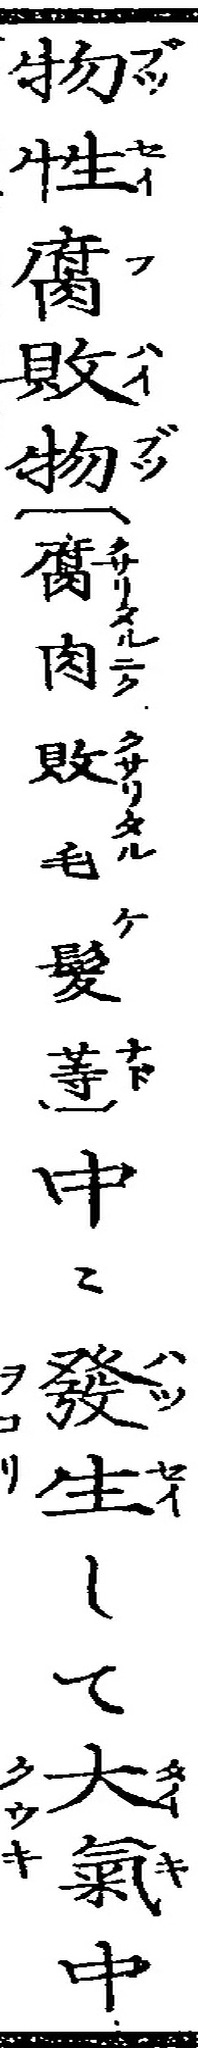物性腐敗物[腐肉敗毛髪等]中に発生して大気中
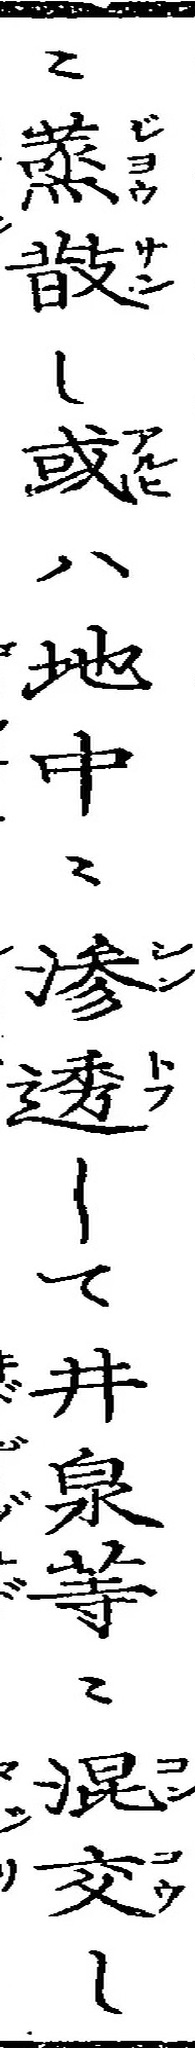に蒸散し或は地中に滲透して井泉等に混交し

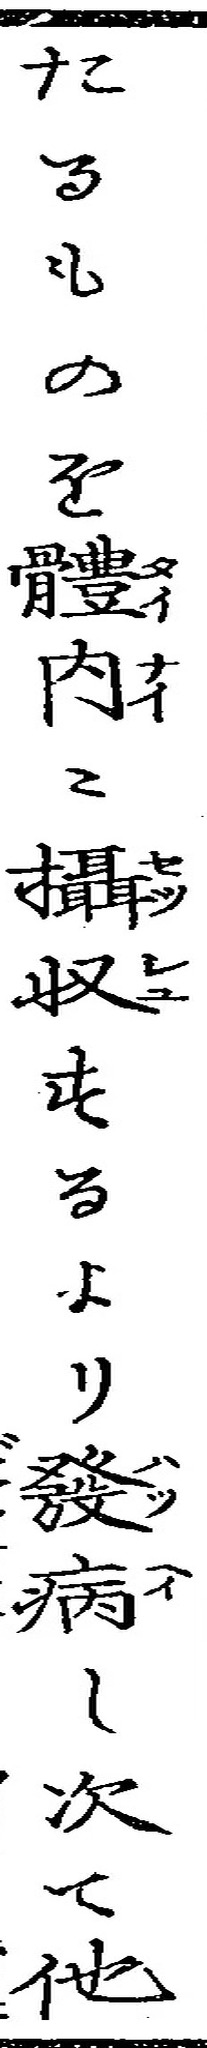たるものを体内に摂収するより発病し次て他
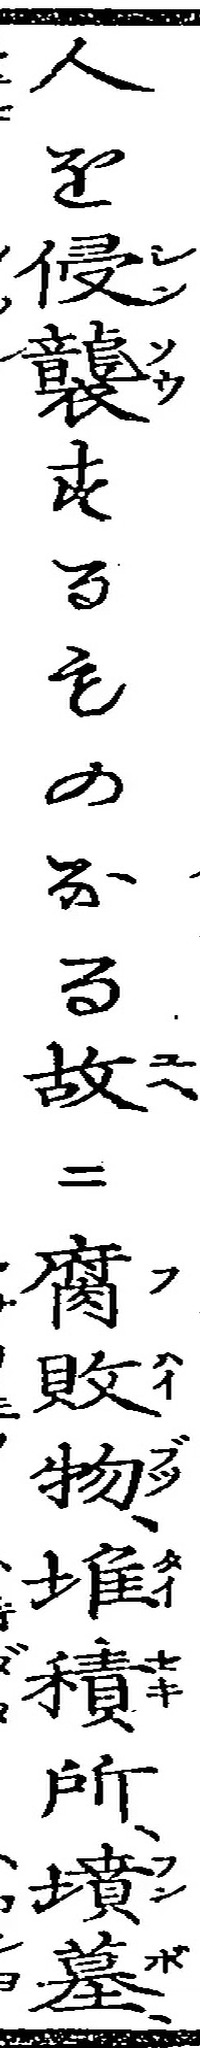人を侵襲するものなる故に腐敗物、堆積所、墳墓、
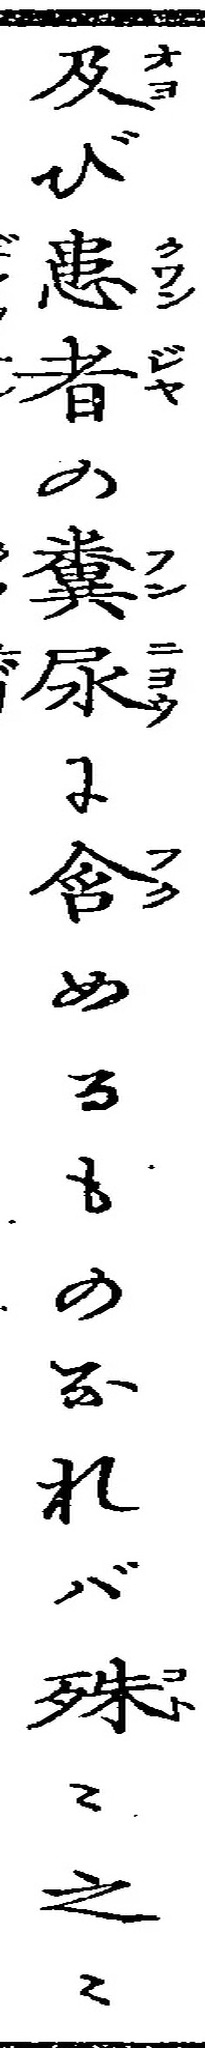及び患者の糞尿に含めるものなれば殊に之に
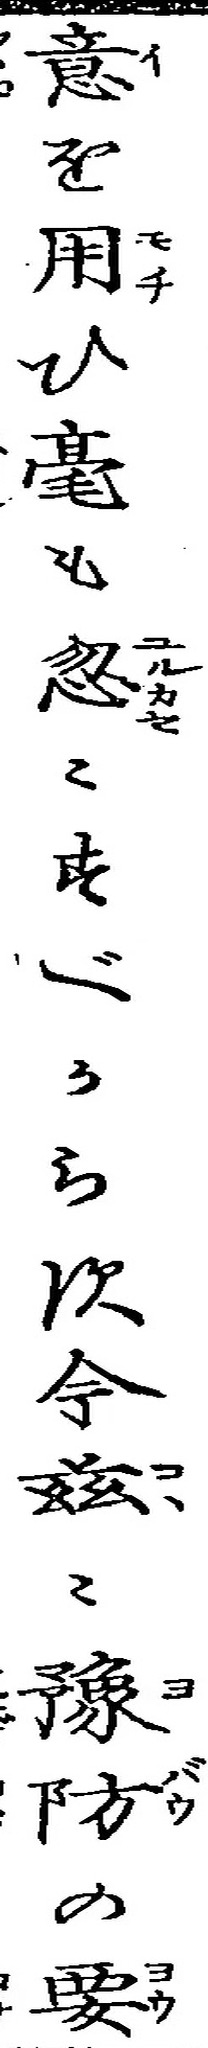意を用ひ毫も忽にすべからす今茲に予防の要
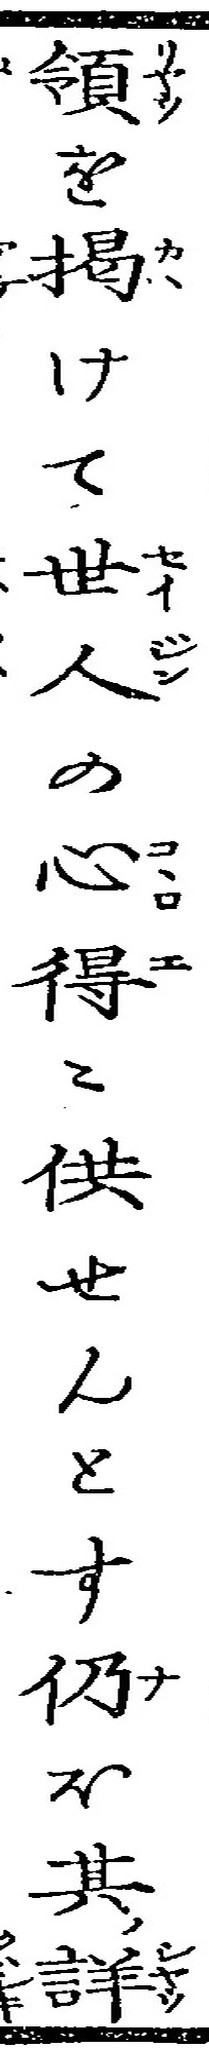領を掲けて世人の心得に供せんす仍ほ其の詳
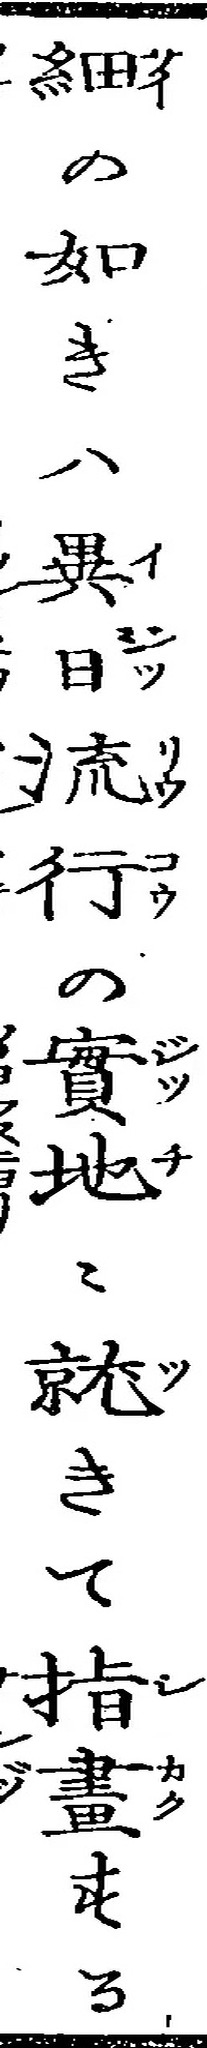細の如きは異日流行の実地に就きて指図する
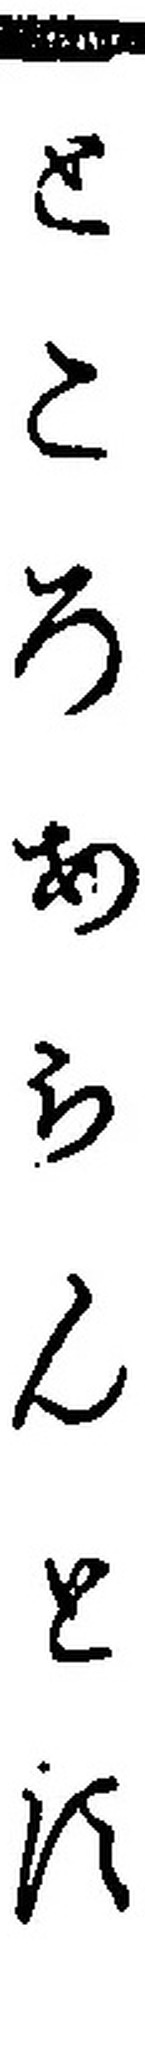ところあらんとす
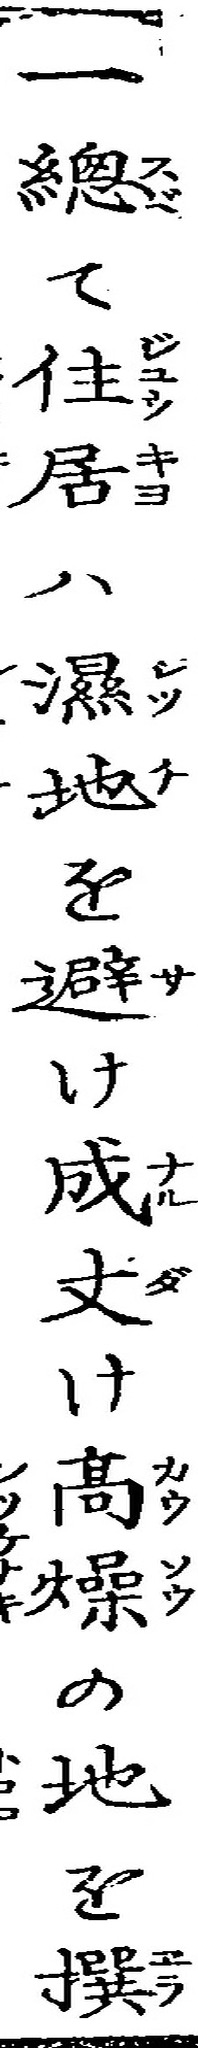一総て住居は湿地を避け成丈け高燥の地を撰
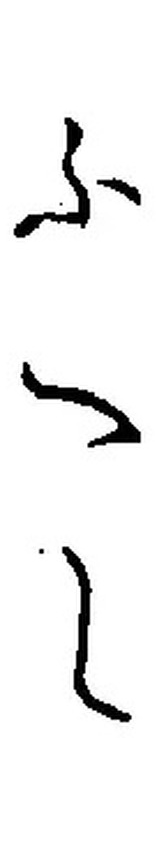ふへし
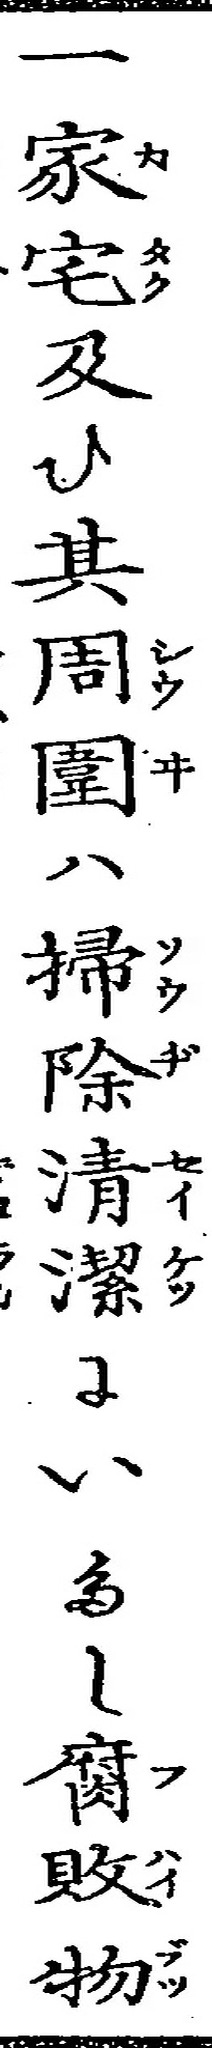一家宅及ひ其周囲は掃除清潔にいたし腐敗物
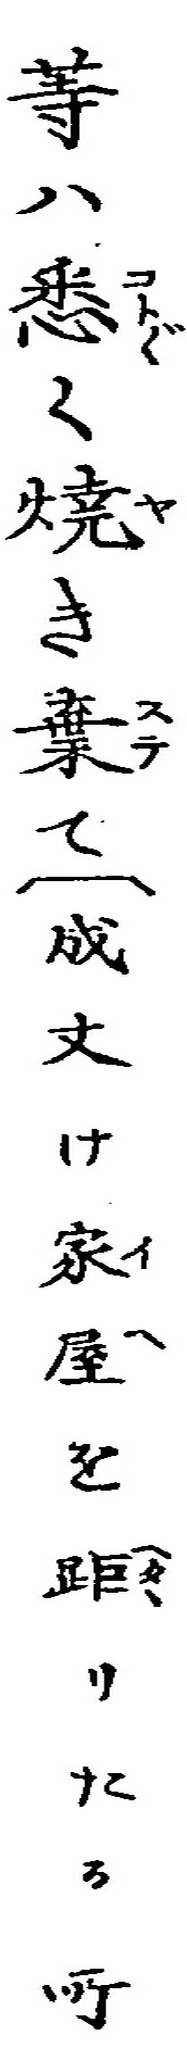等は悉く焼き棄て[成丈け家屋を距りたる所
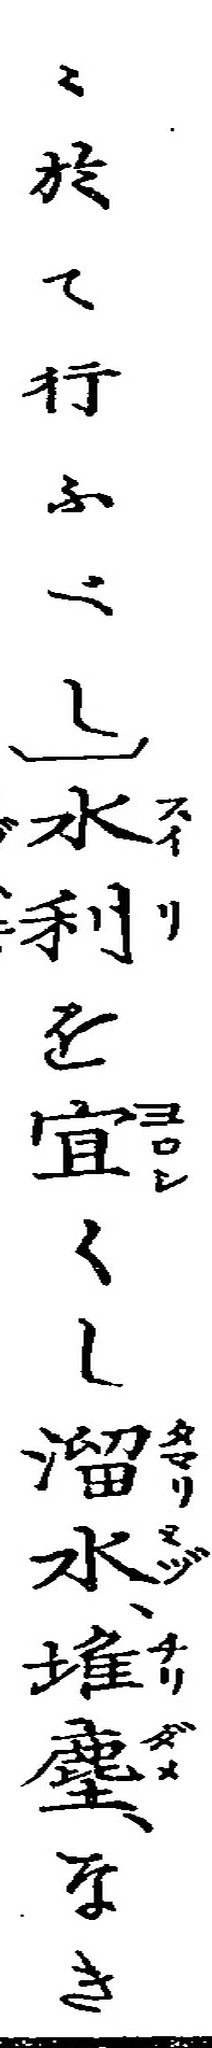に於て行ふべし]水利を宜くし溜水、堆塵、なき
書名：伝染病予防法
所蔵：国立国会図書館 National Diet Library, JAPAN
